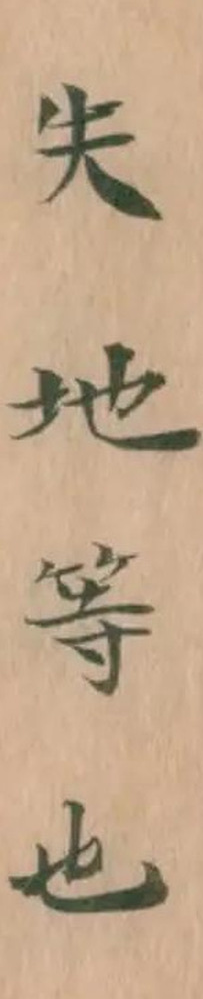失地等也
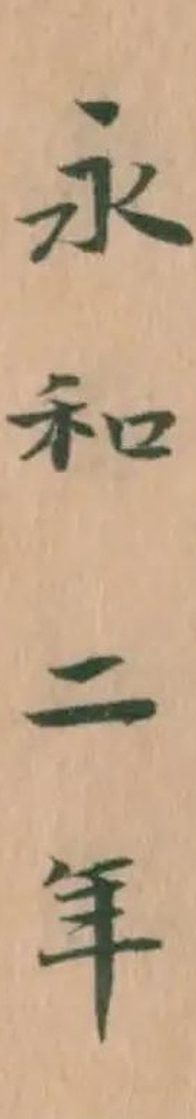永和二年
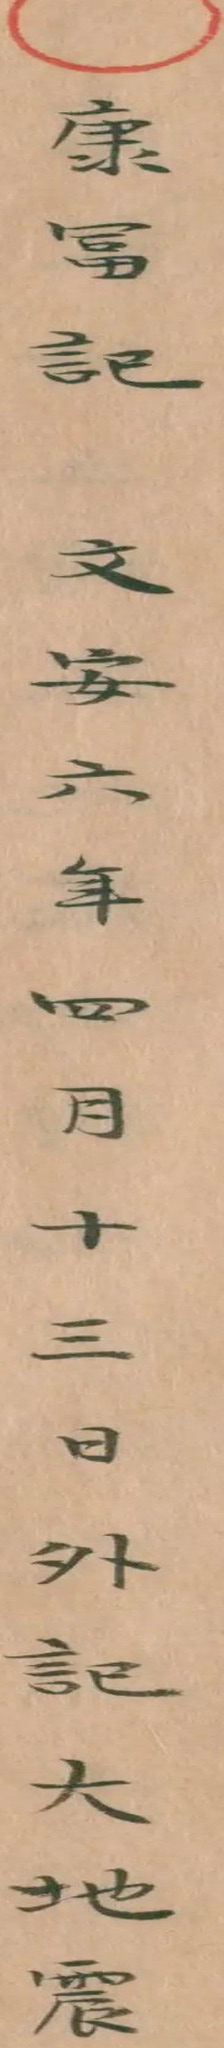○康富記文安六年四月十三日外記大地震
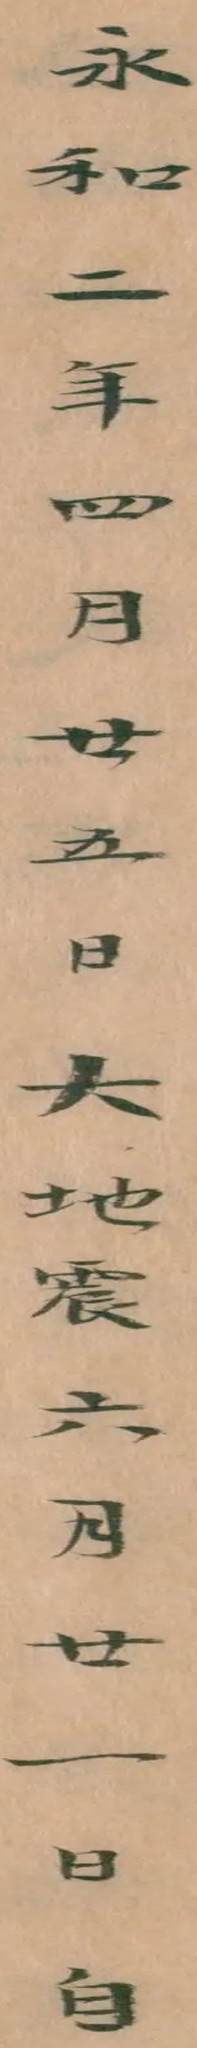永和二年四月廿五日大地震六月廿一日自
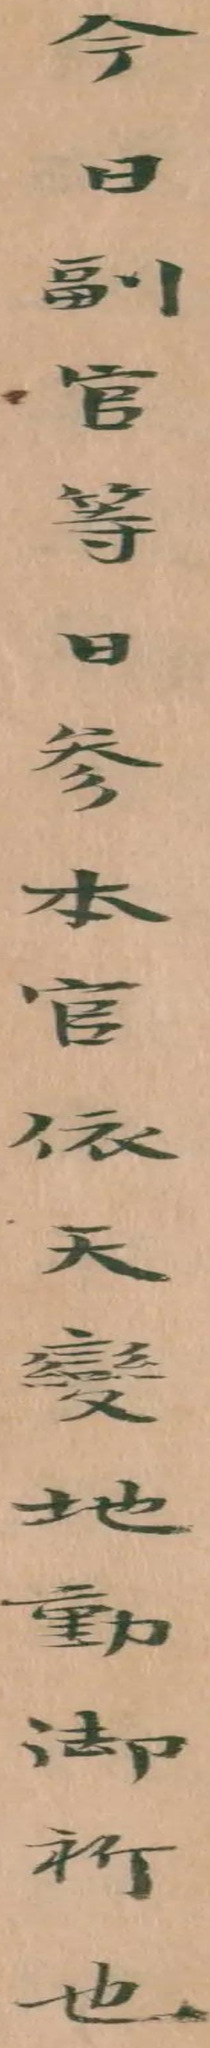今日副官等日参本官依天変地動御祈也
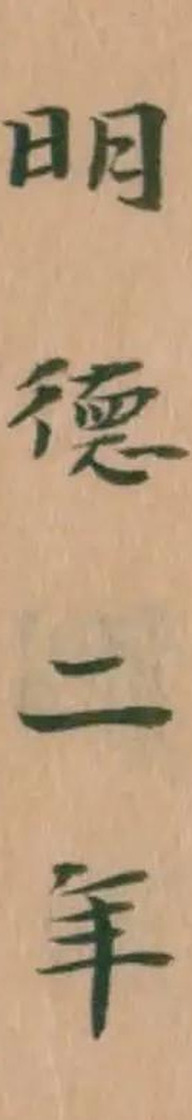明徳二年
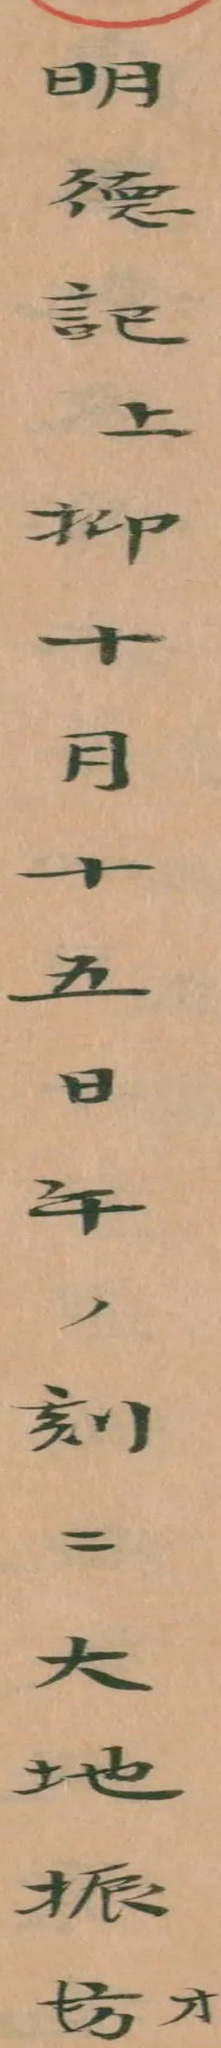○明徳記上抑十月十五日午ノ刻ニ大地振
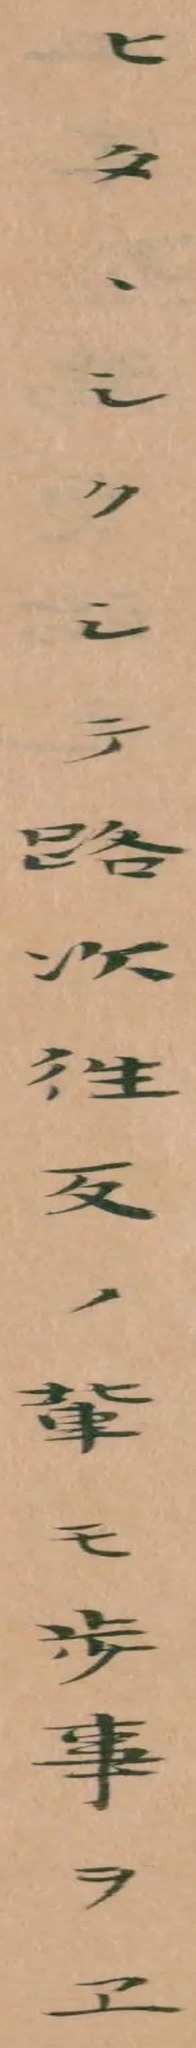ヒタヽシクシテ路次往反ノ輩モ歩事ヲヱ
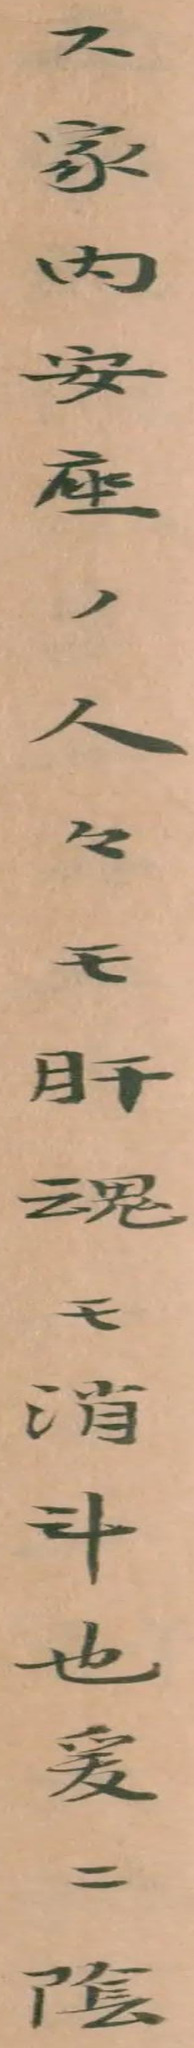ス家内安座ノ人々モ肝魂モ消計也爰ニ陰
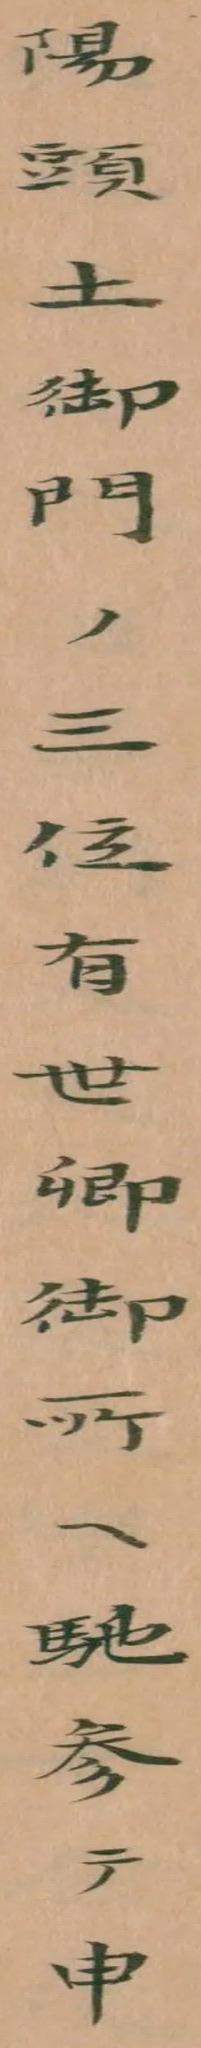陽頭土御門ノ三位有世卿御所ヘ馳参テ申
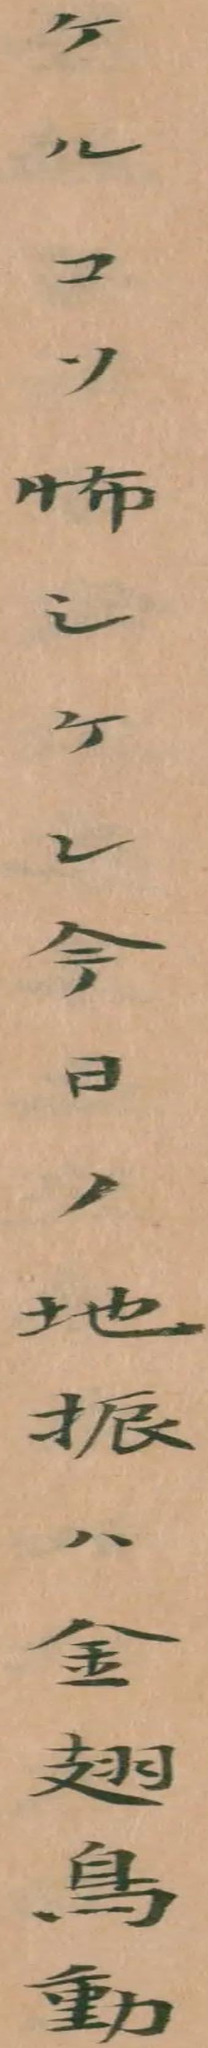ケルコソ怖シケレ今日ノ地振ハ金翅鳥動
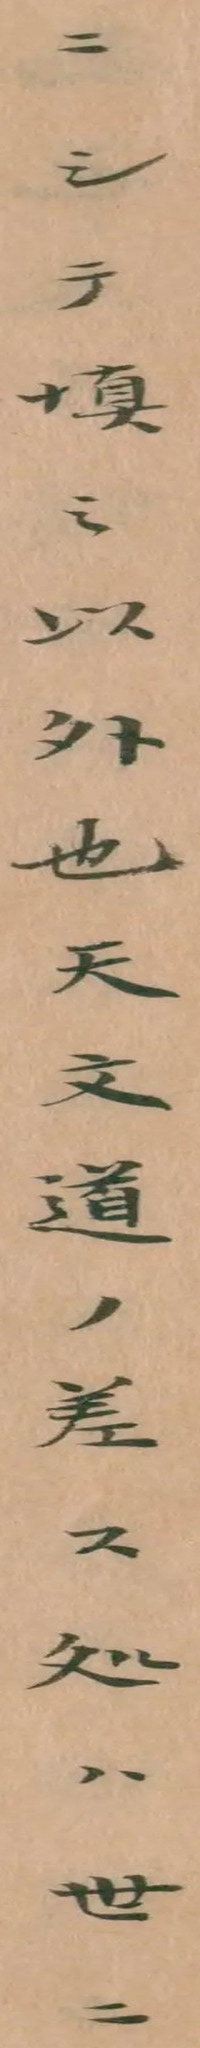ニシテ填之以外也天文道ノ差ス処ハ世ニ
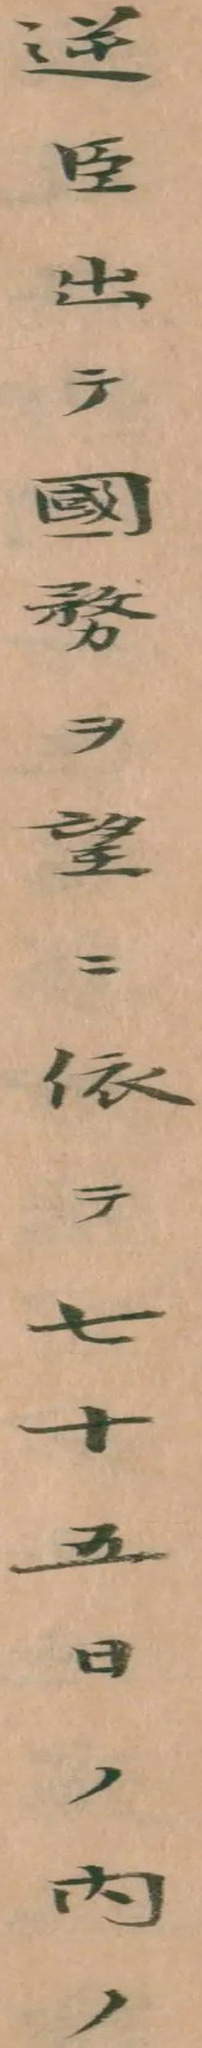逆臣出テ国務ヲ望ニ依テ七十五日ノ内ノ
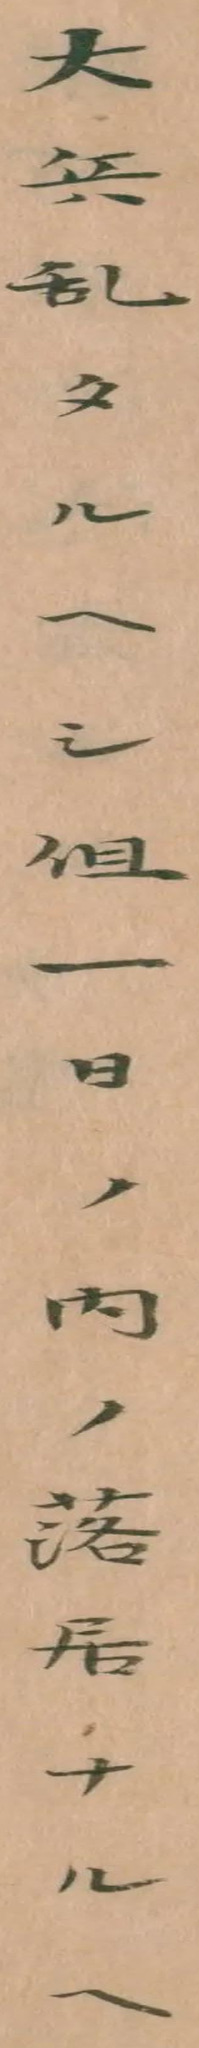大兵乱タルヘシ但一日ノ内ノ落居ナルヘ
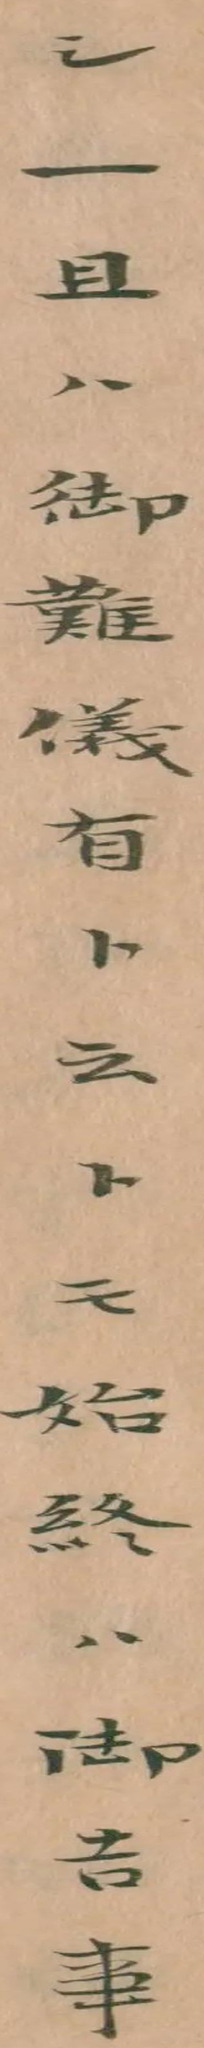シ一旦ハ御難儀有ト云トモ始終ハ御𠮷事
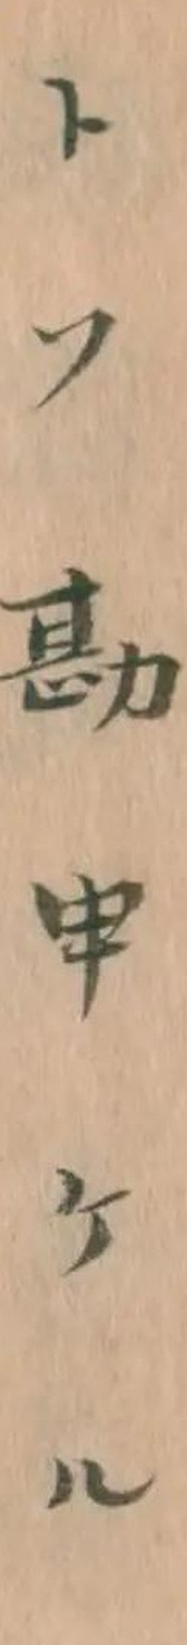トソ勘申ケル
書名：地災撮要. 巻5-6(地震之部)
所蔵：国立国会図書館 National Diet Library, JAPAN
